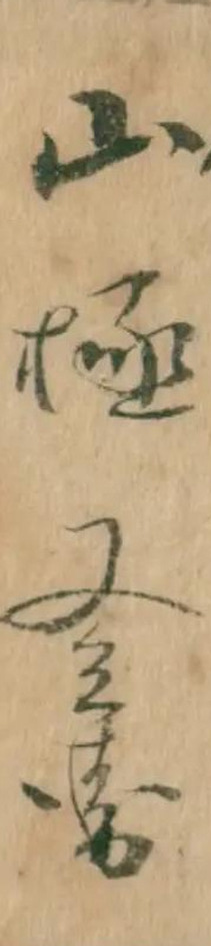山際又兵衛
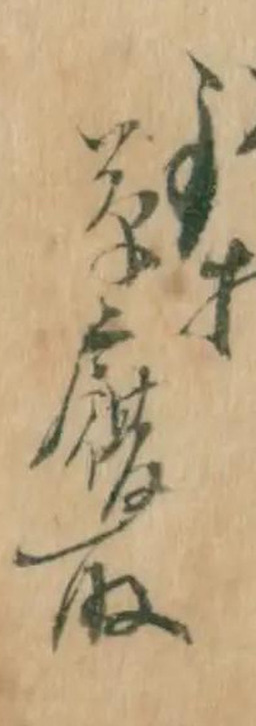草履取

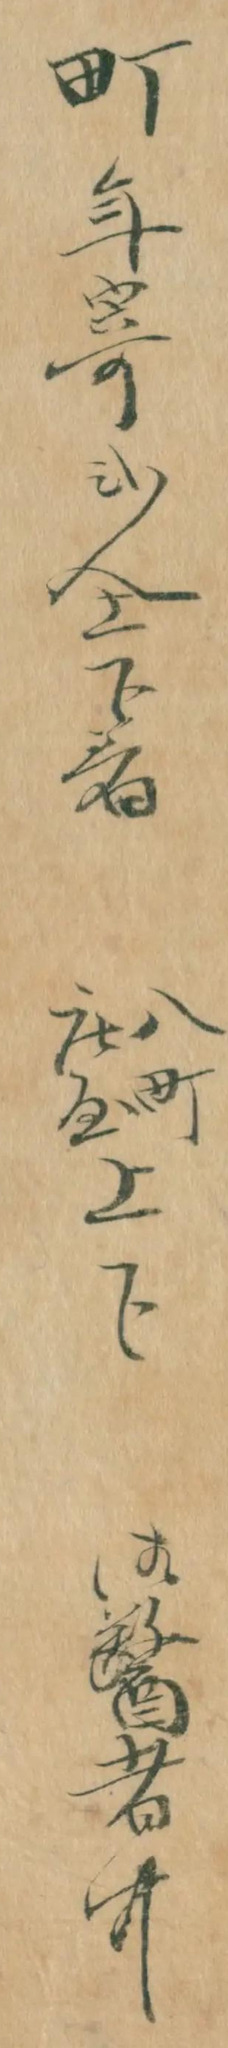町年寄弐人上下着八町庄屋上下御医者共
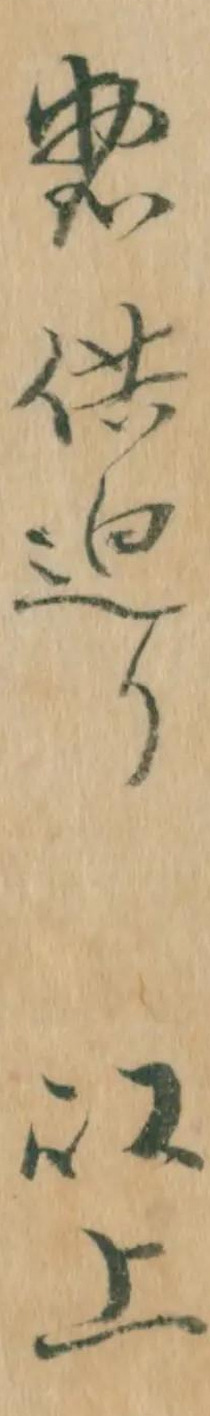惣供廻り以上
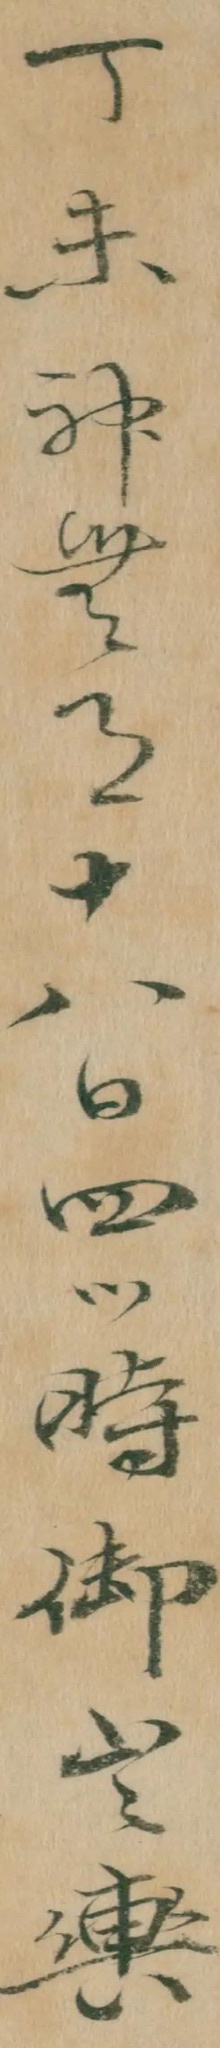丁未神無月十八日四ツ時御出輿
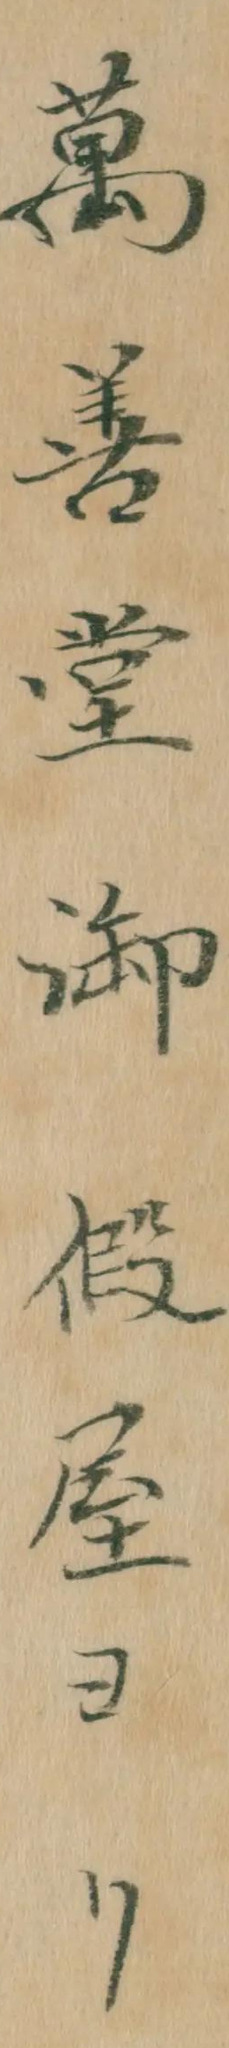萬善堂御仮屋ヨリ
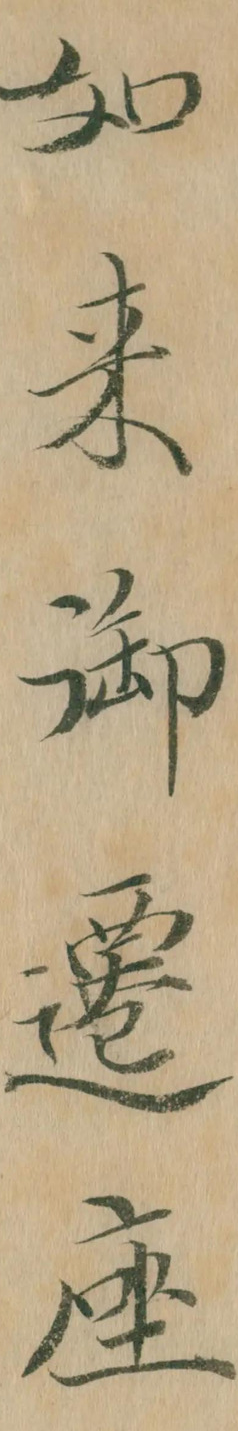如来御遷座
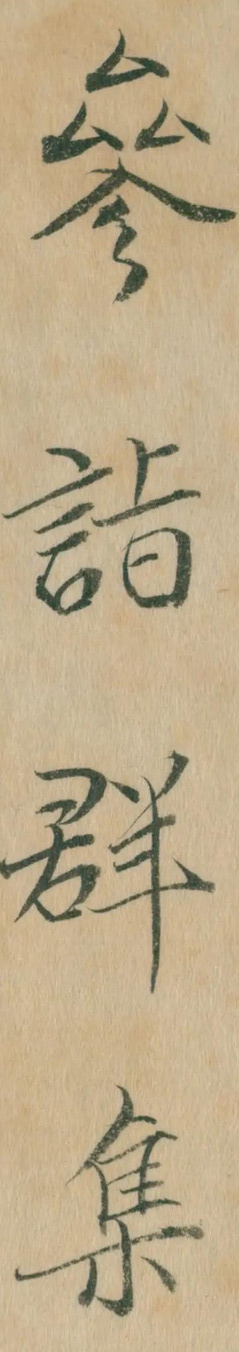参詣群集
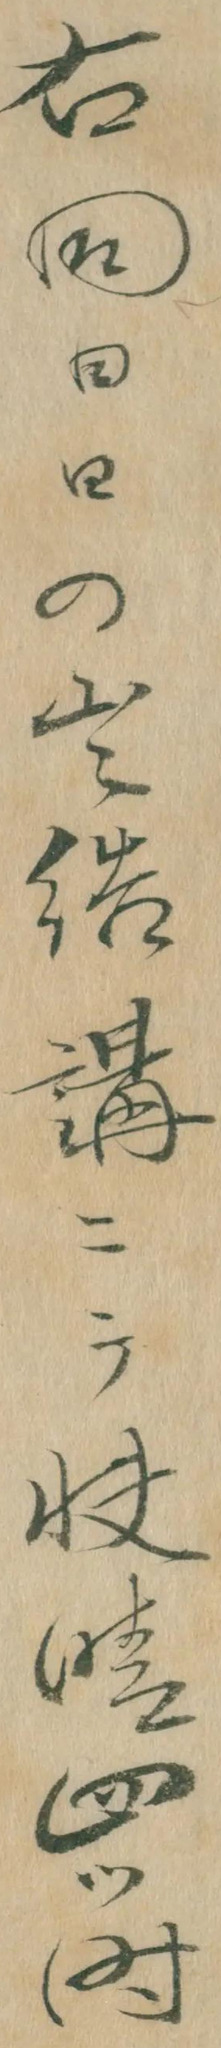右同日日の出結講ニテ快晴四ツ時
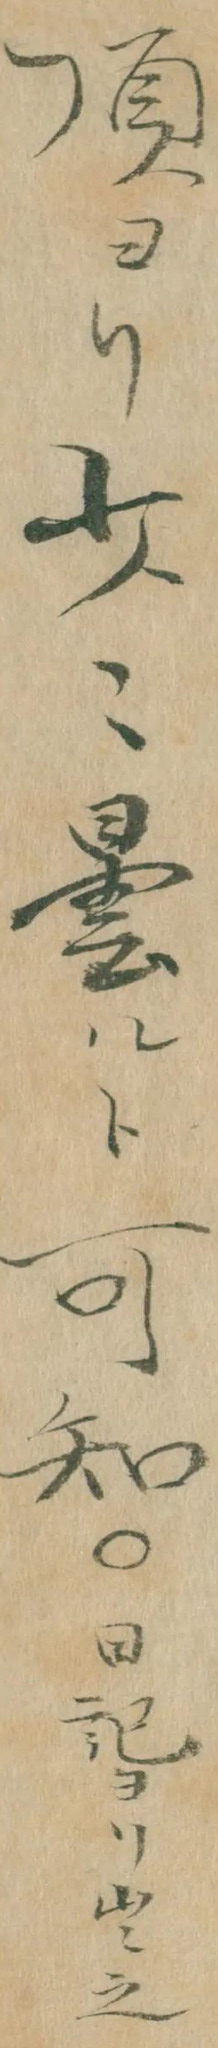頃ヨリ少々曇ルト可知○日記ヨリ出之

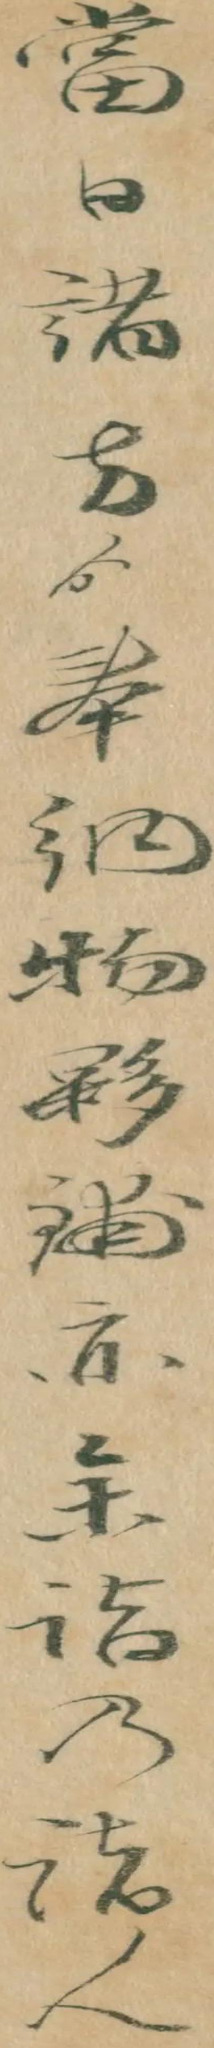当日諸方ゟ奉納物夥鋪亦参詣の諸人
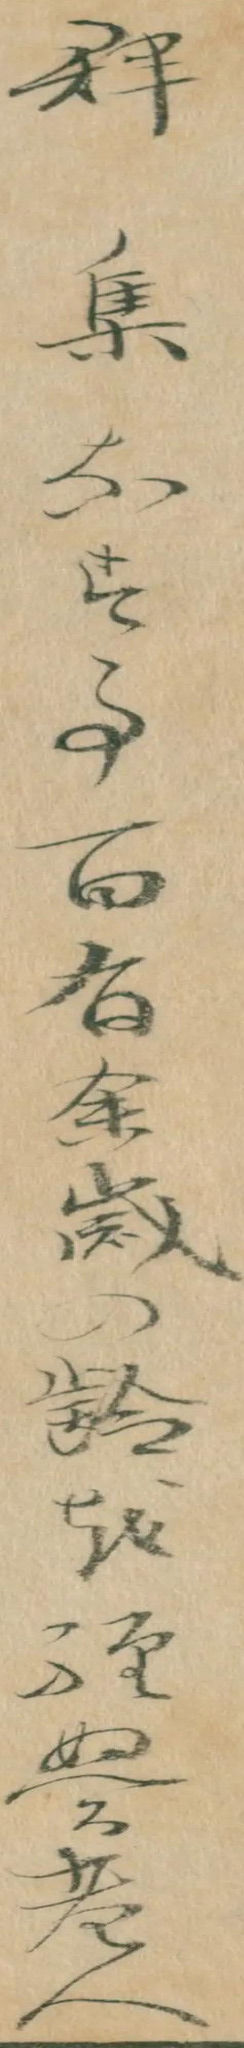群集なす事百有余歳の齢を経ぬる老人
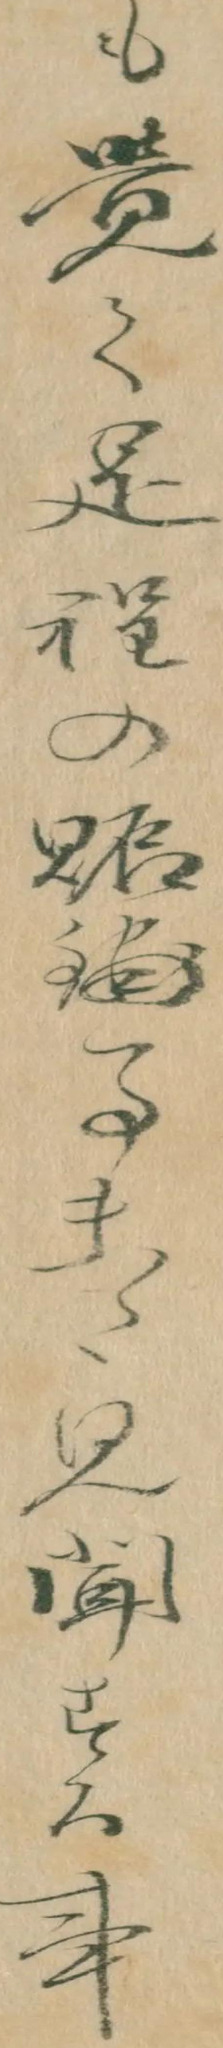も覚て是程の賑鋪事未た見聞する事
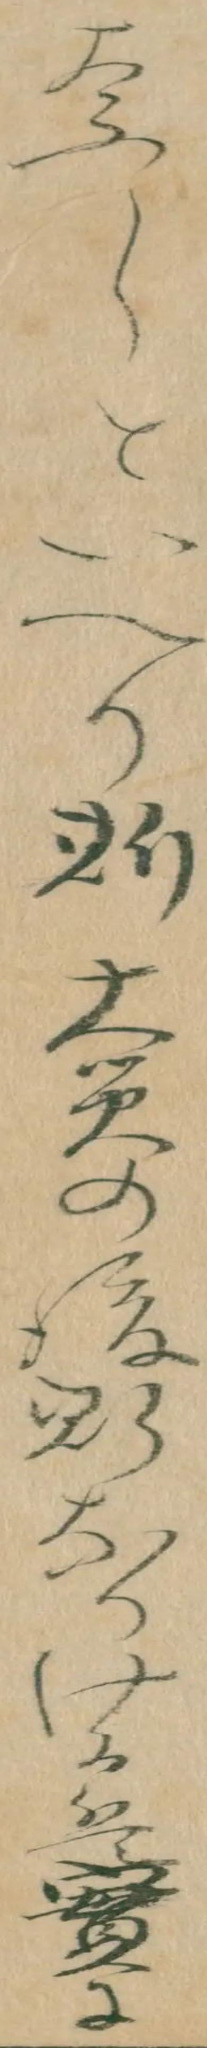なしといへり斯大災の後斯なりけるは実に
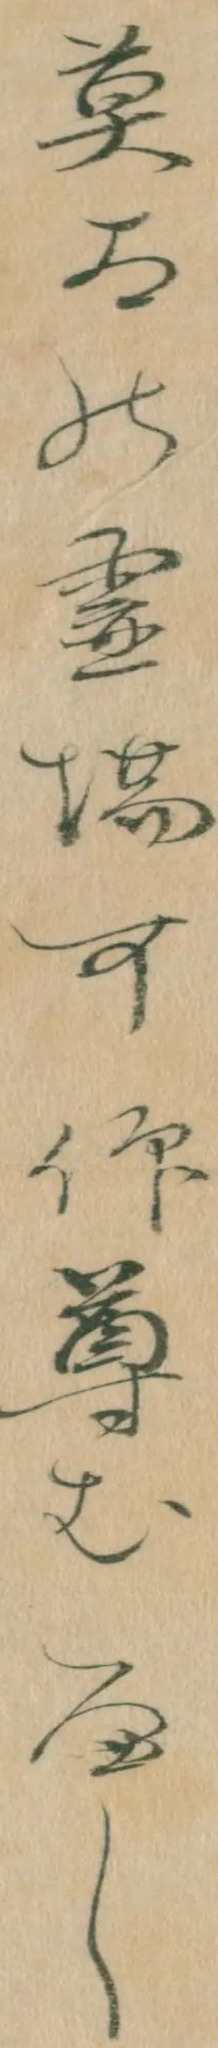莫太の霊場可仰尊むへし
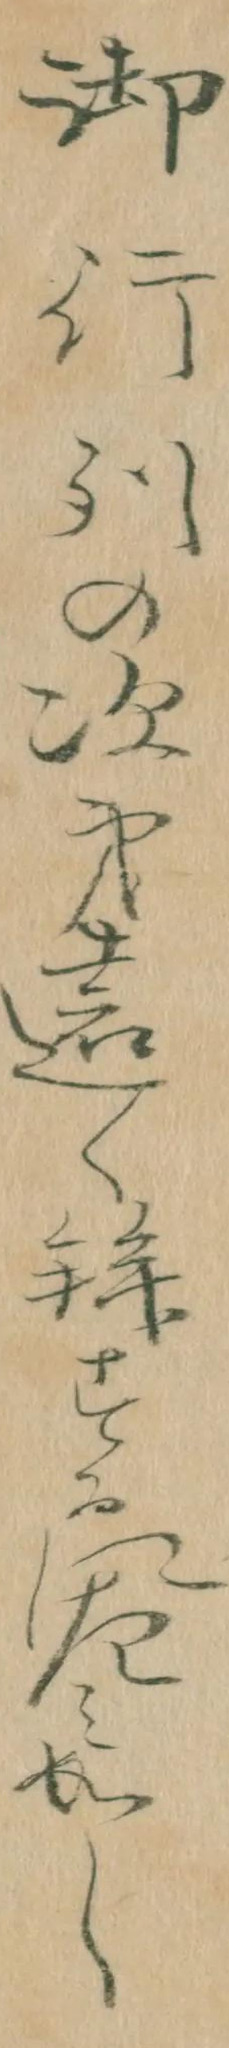御行列の次第遠く拝するに左之如し
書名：俗語之種. [7]
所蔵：国立国会図書館 National Diet Library, JAPAN
